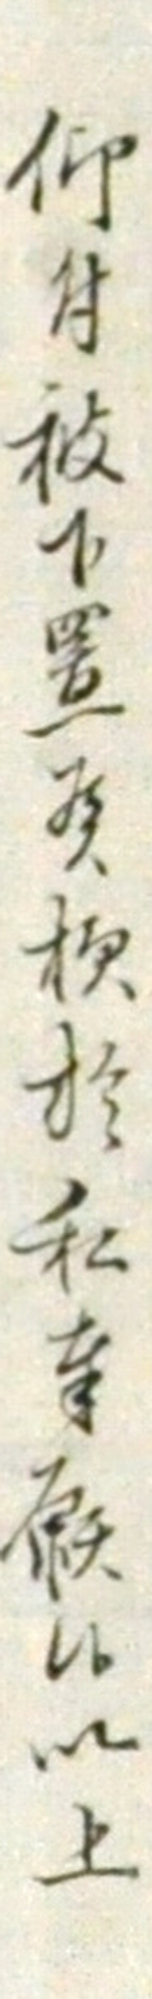仰付被下置候様於私奉願候以上
